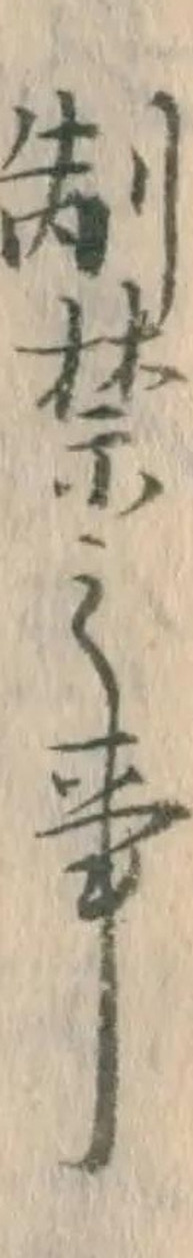制禁之事
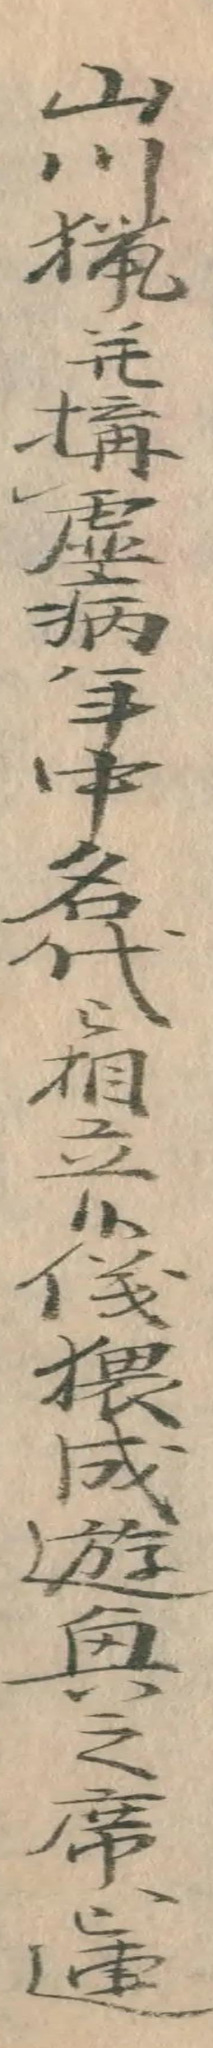山川猟并虚病年中名代被相立候儀猥成遊興之席へ被連
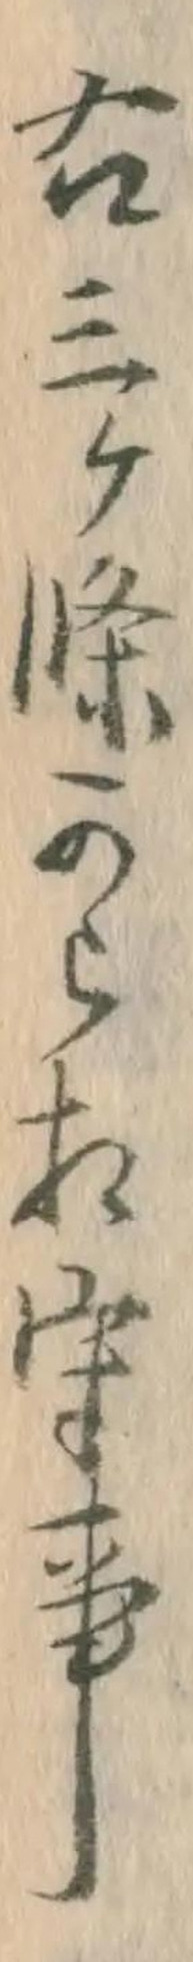右三ヶ條可被相守事

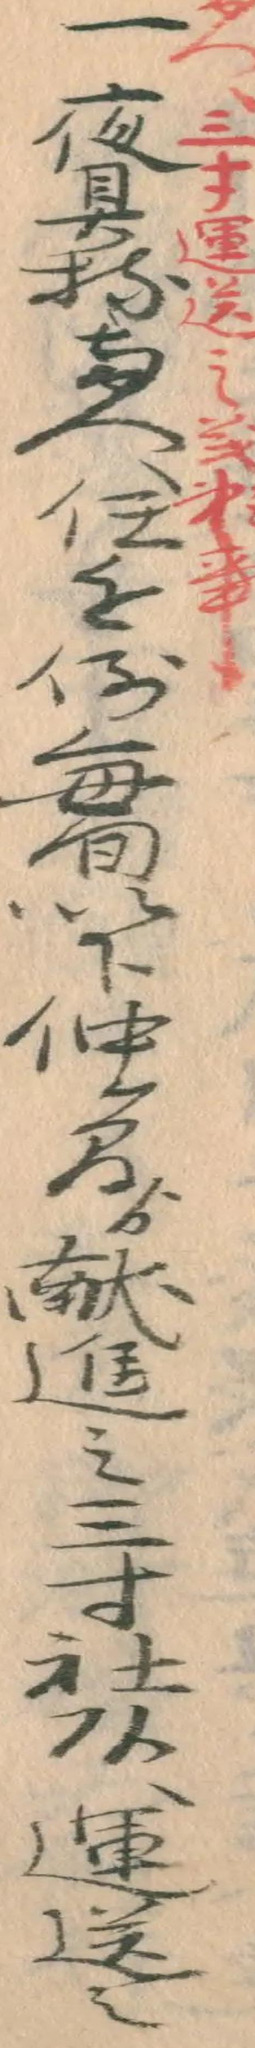一夜具持両人へ任遣近例毎旬以下仲ヶ間ゟ献進之三寸社頭ヘ運送之
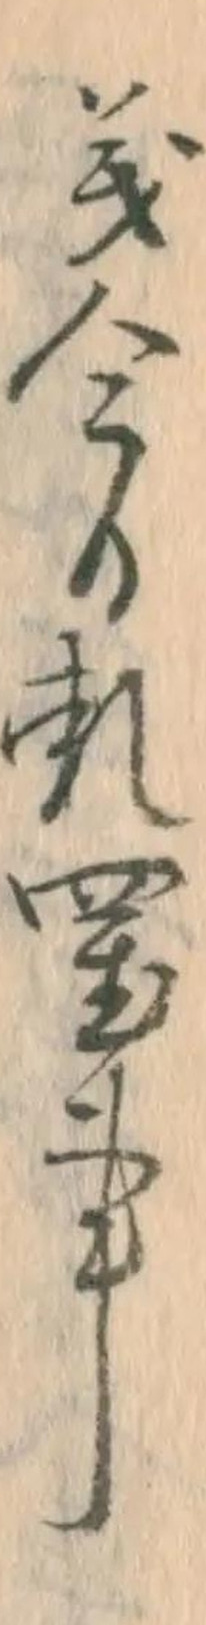義今日頼置事
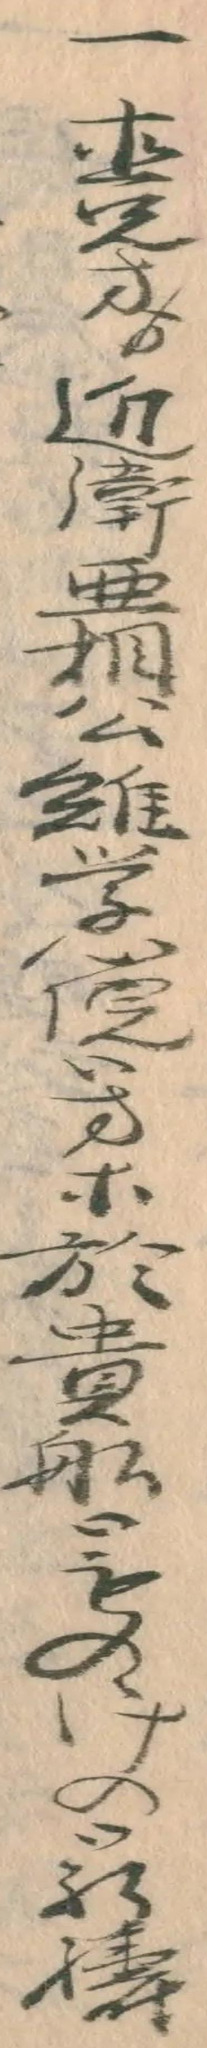一直兄方ゟ近衛相公雉維学心院御方等於貴舩御ものゝけの御祈祷
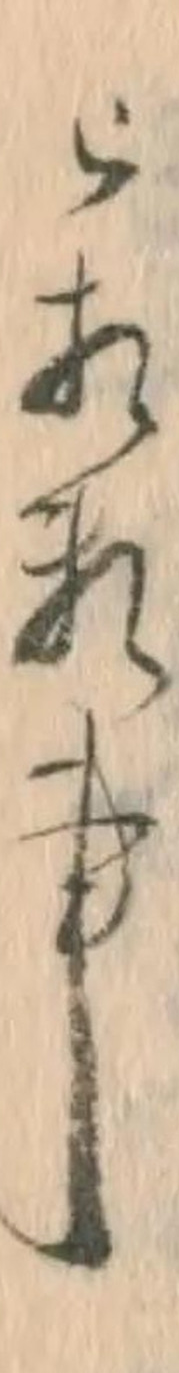被相頼事
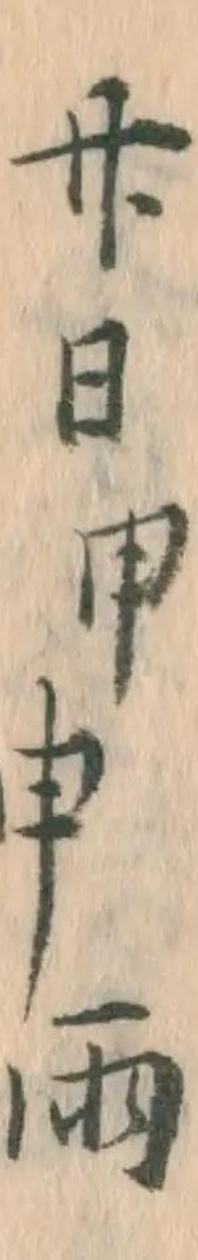廿日甲申雨
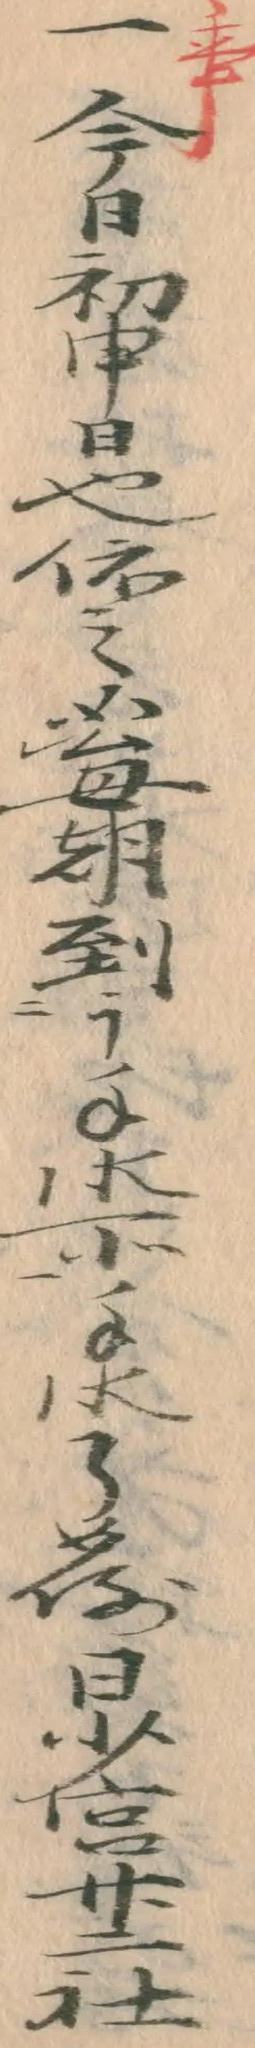一今日初申日也依之必毎朝到手水所手水了如例日少宮廿二社
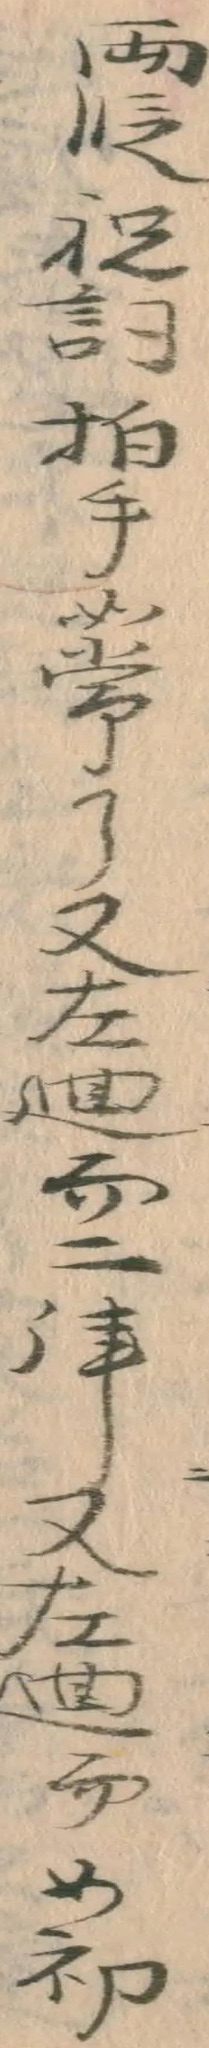両段祝詞拍手如常了又左廻而二拝又左廻而如初
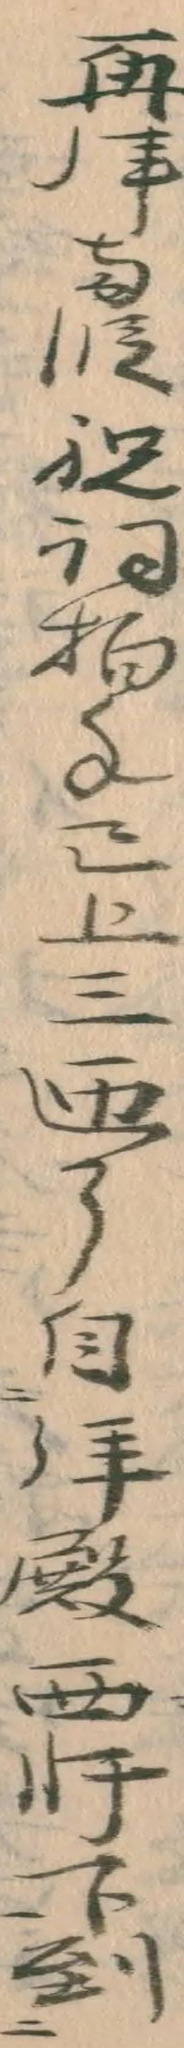再拝両段祝詞拍手已上三匝了自拝殿西軒下到
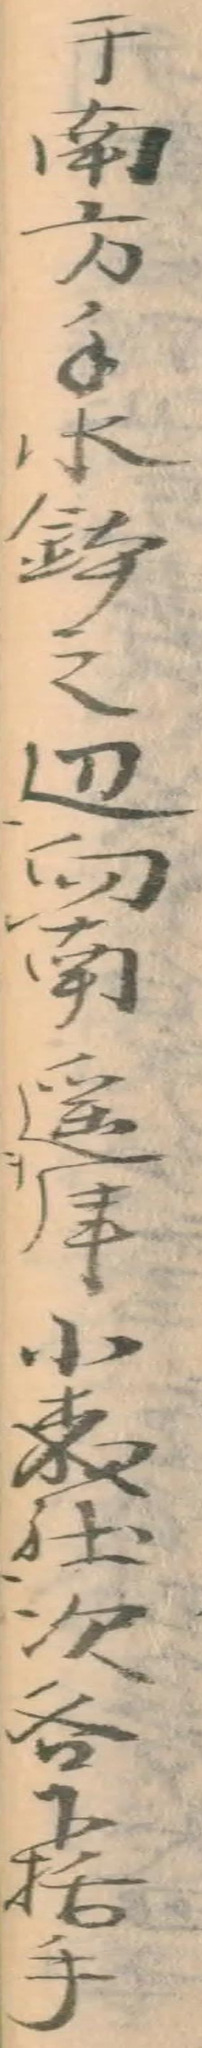于南方手水鉢之辺向南遥拝小森社次各下括手
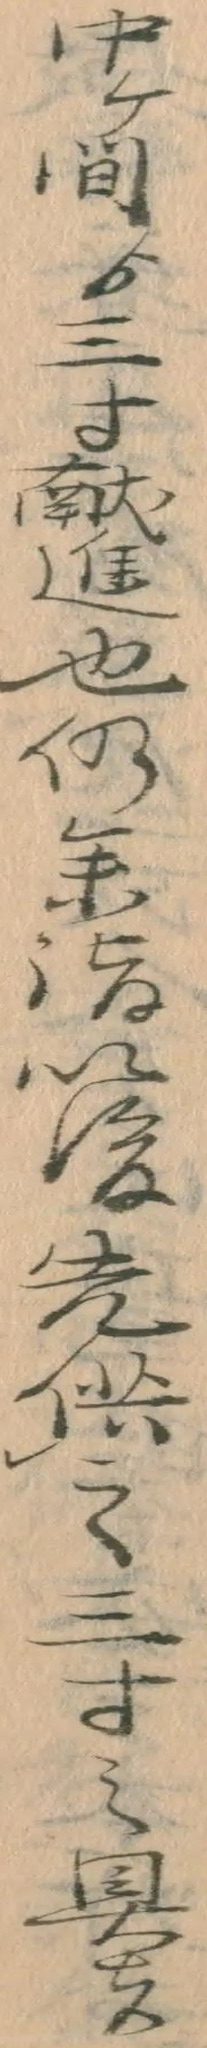中ケ間ゟ三寸献進也仍参詣以後先供之三寸之具者
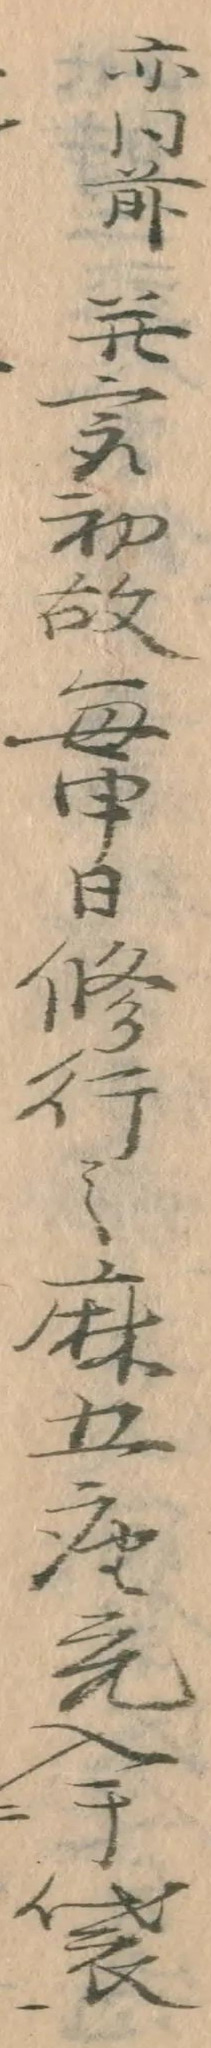亦同前并最初故毎申日修行之麻五座充入于袋
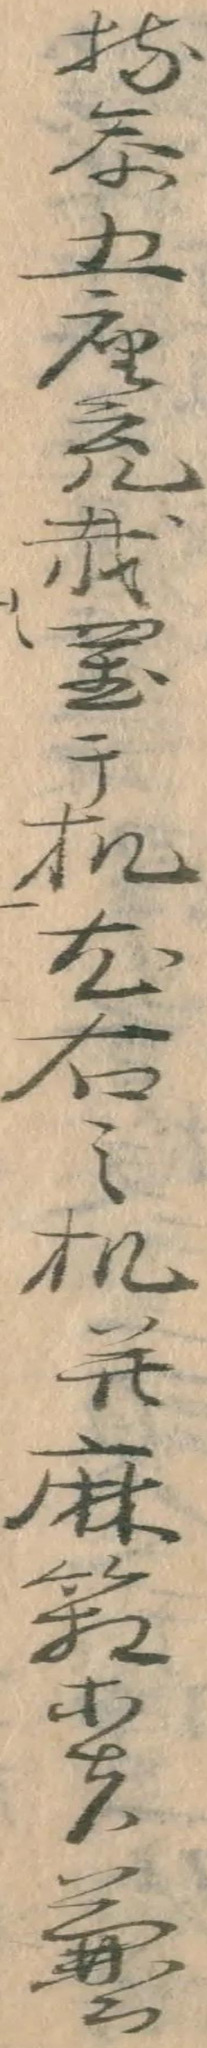持参五座充載置于机尤右之机幷麻箱等者兼而
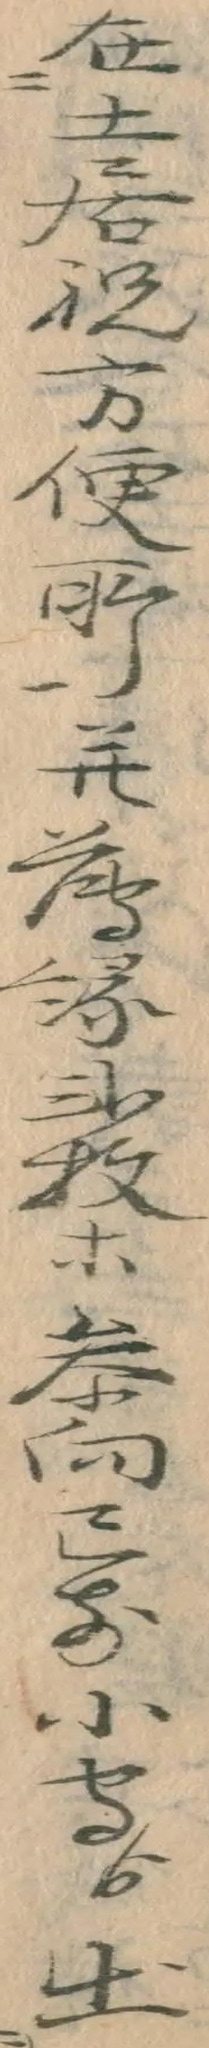在土居祝方便所并薄縁弐枚等参向已前小守ゟ出
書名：賀茂社記録. 第72冊
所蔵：国立国会図書館 National Diet Library, JAPAN
